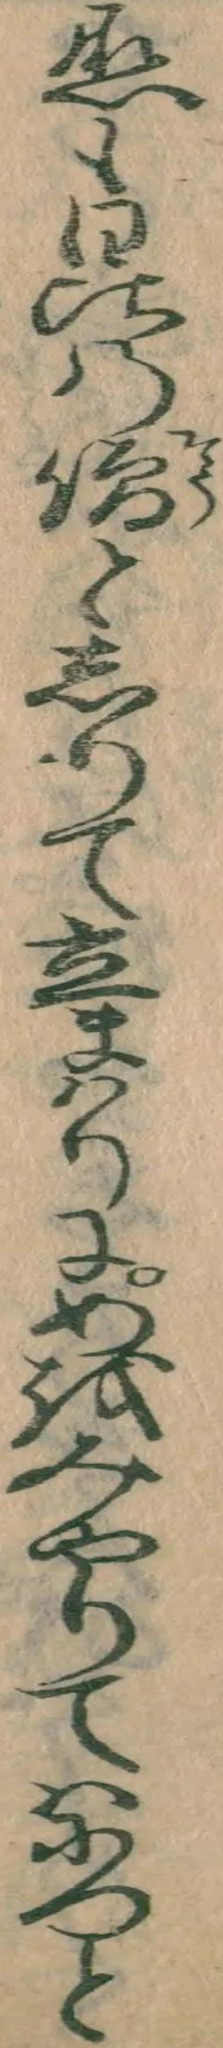丞も日比の僧としりて立まはりに。めをみやりてはにつと
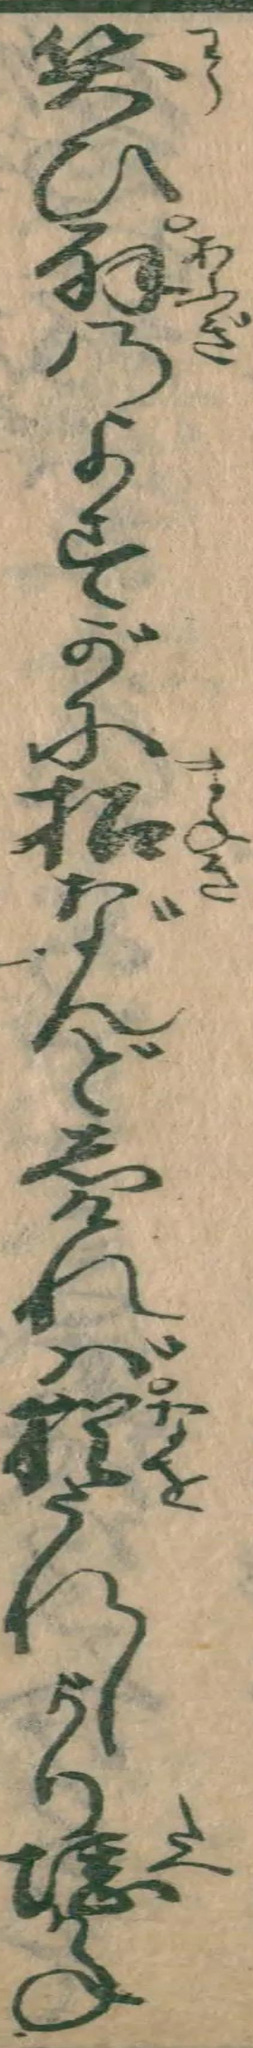笑ひ。扇のよすがに招なんどしければ。猶うれしがり堪かね
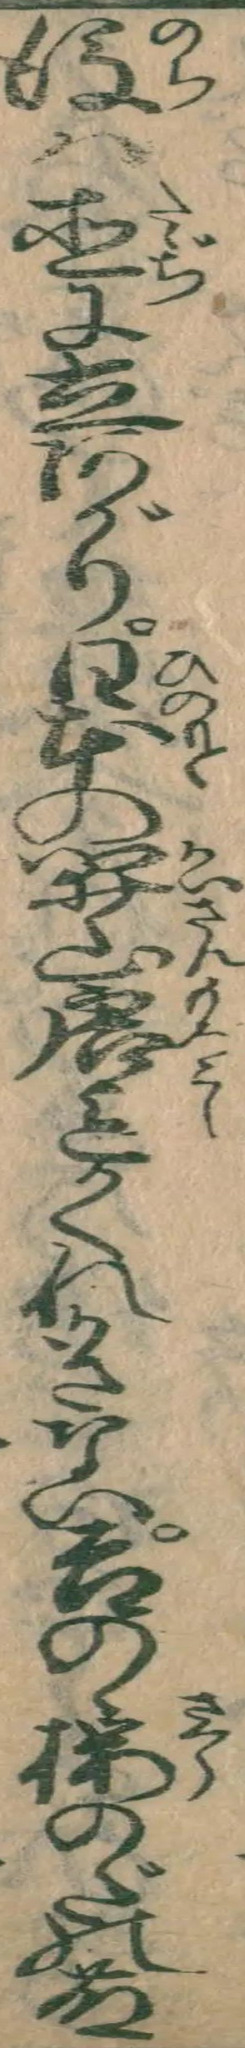後は直に立あがり。日本の開山唐迄かくれ御さない。吉のゝ桜のだの藤
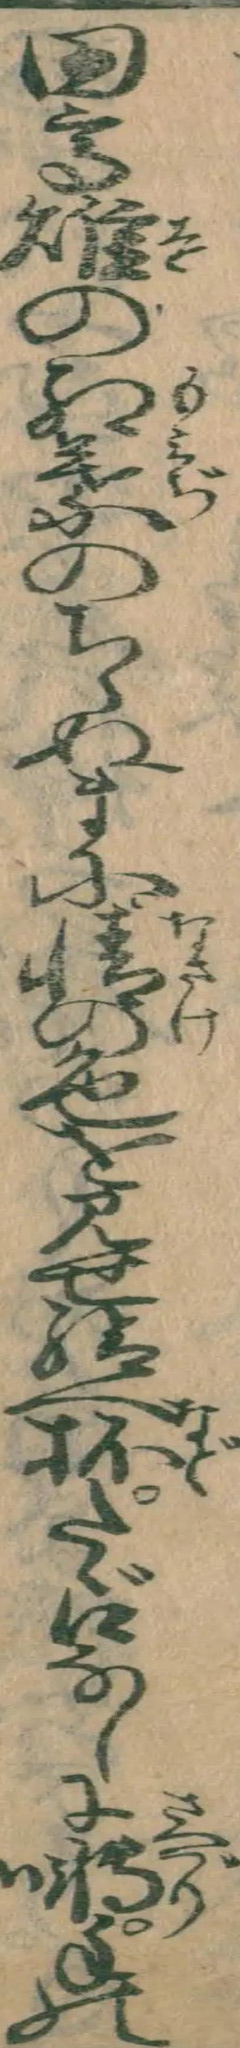田高雄の紅葉のちらぬまに情の色を見せ給へ抔。たゞ口なしに囀。手の

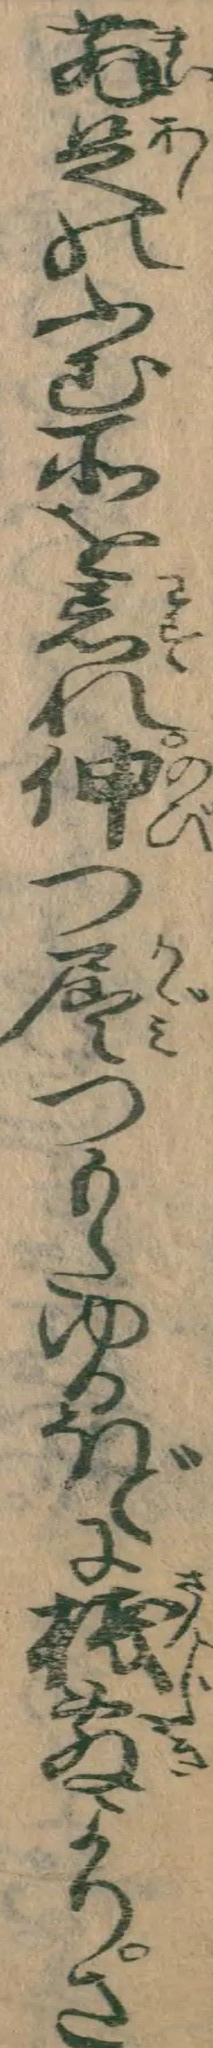舞足のふむ所を忘れ。伸つ屈つもたゆるほどに桟敷より。さ
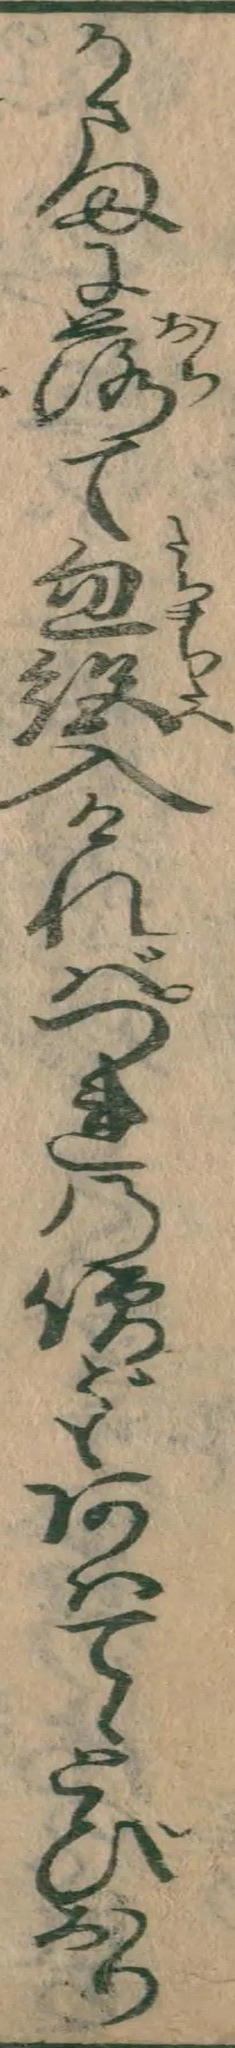かさまに落て忽絶入ければ。つれの僧どもあはてゝとびおり
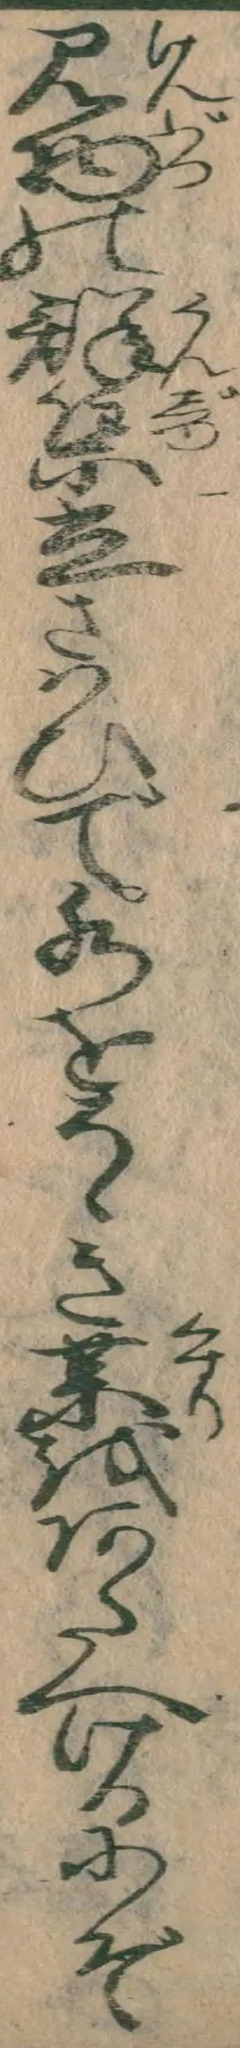見物の群集立さはひで。水をそゝき薬をあたへけるにぞ
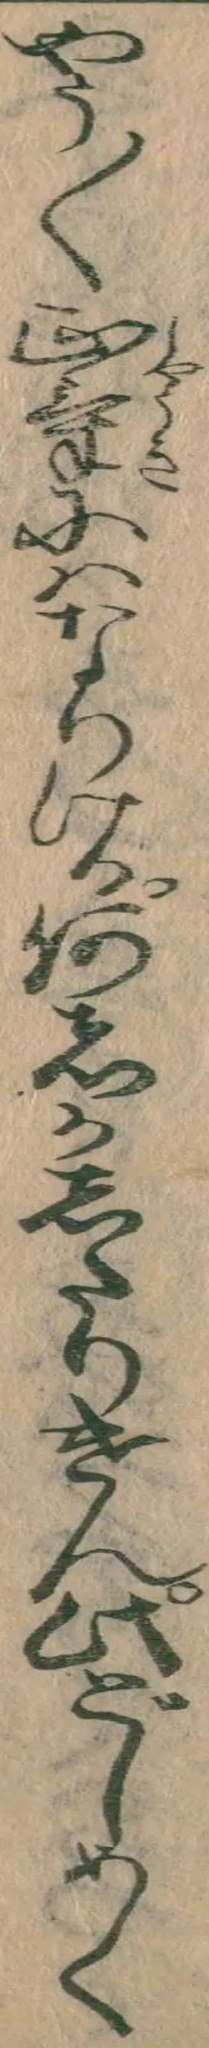やう〳〵正気にはなりける。何者かしたりけん。此どしめく
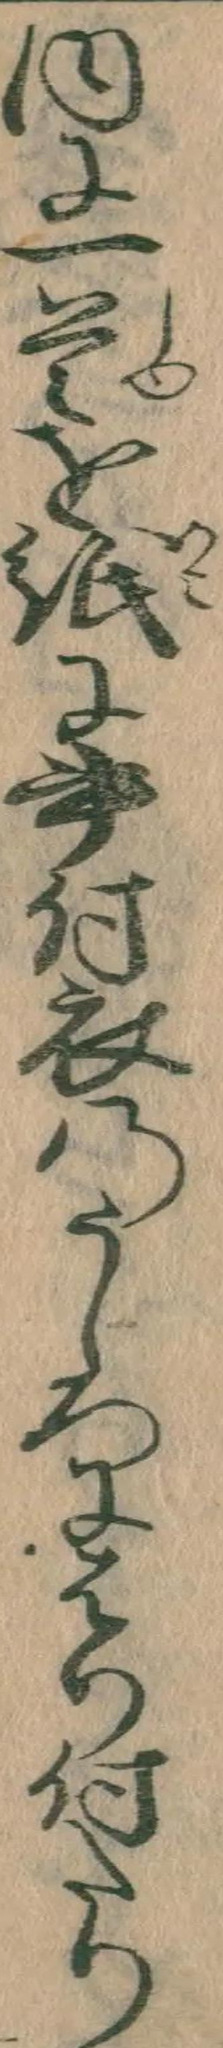内に一首を紙に書付衣のうしろにはり付たり
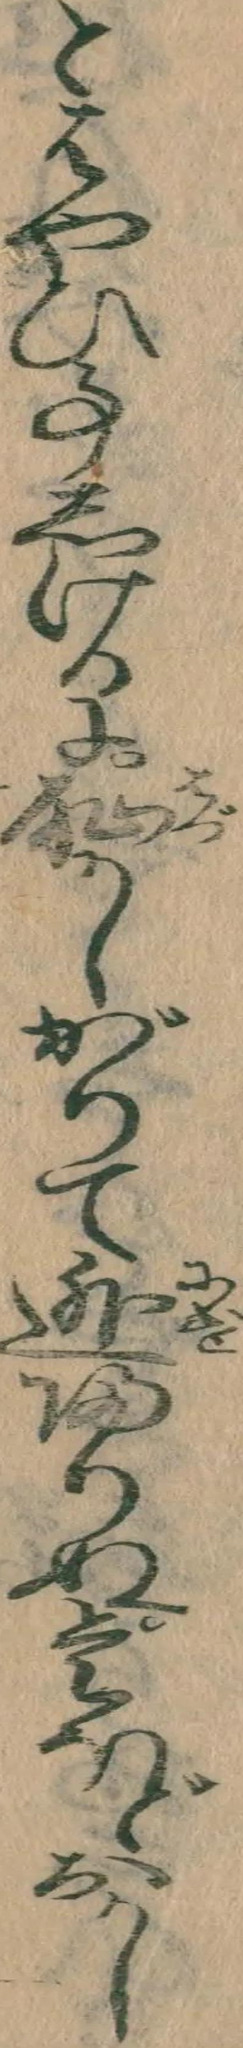とはやひ事しけるに。恥かしがりて逃帰りぬ。是ほどおかし
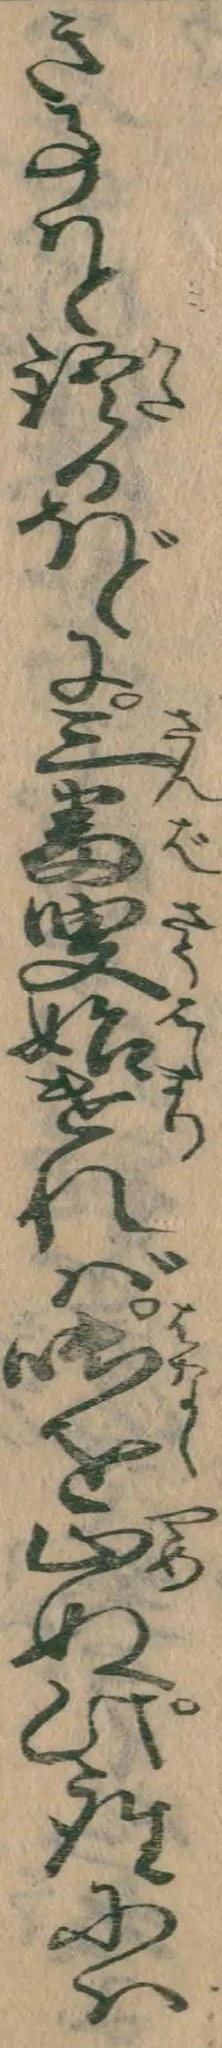き事はと語るほどに。三番叟始ければ。咄を止ぬ。此座には
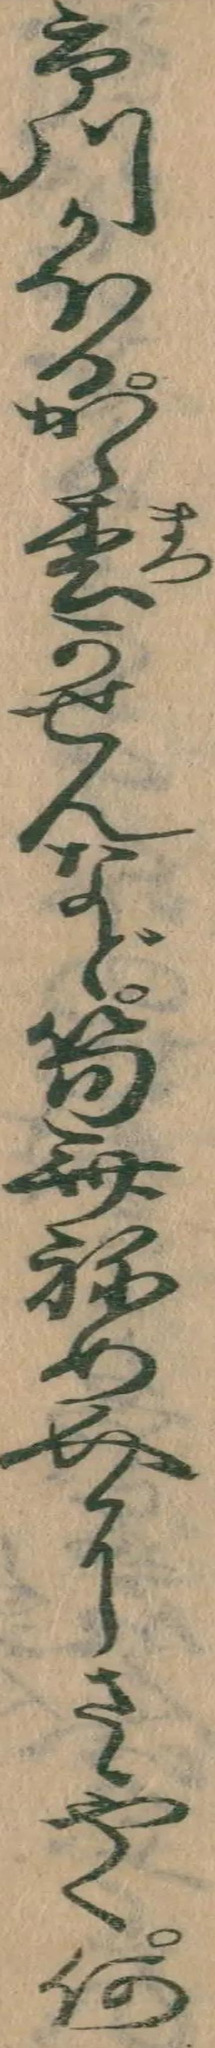市川かほる。から松かせんなど。筍斎ねめ介にさゝやく。何
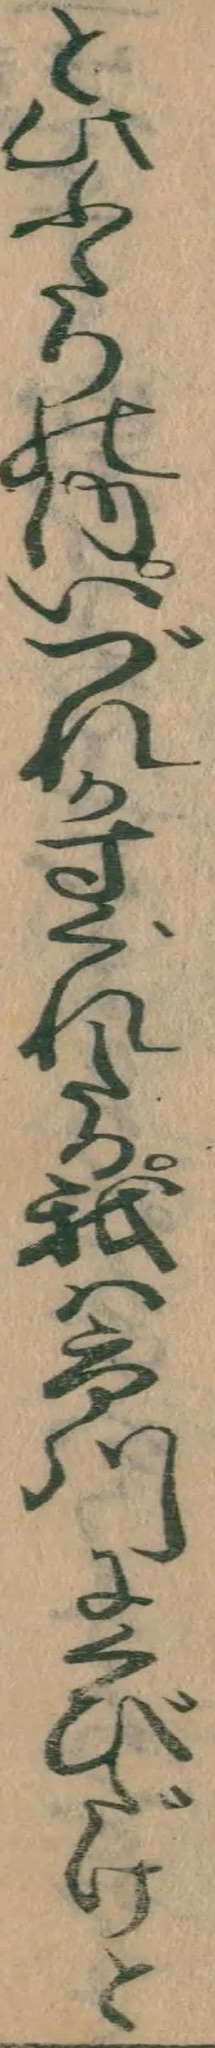と此ふたりの内。いづれかすぐれたる。我は市川にくびだけと
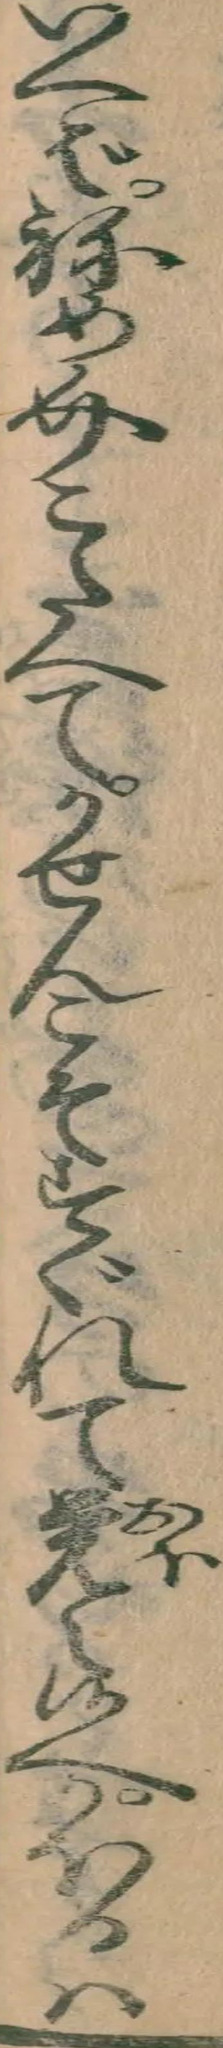いへば。ねめ介こたへて。かせんこそすぐれて覚え候へ。かほるは
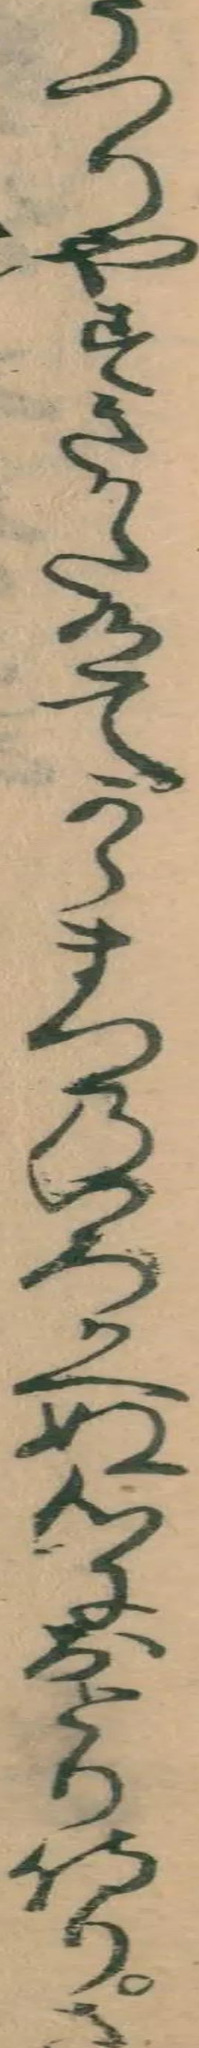うつりやすきかた有て。からまつのいろかへぬ心におとり侍り。さ
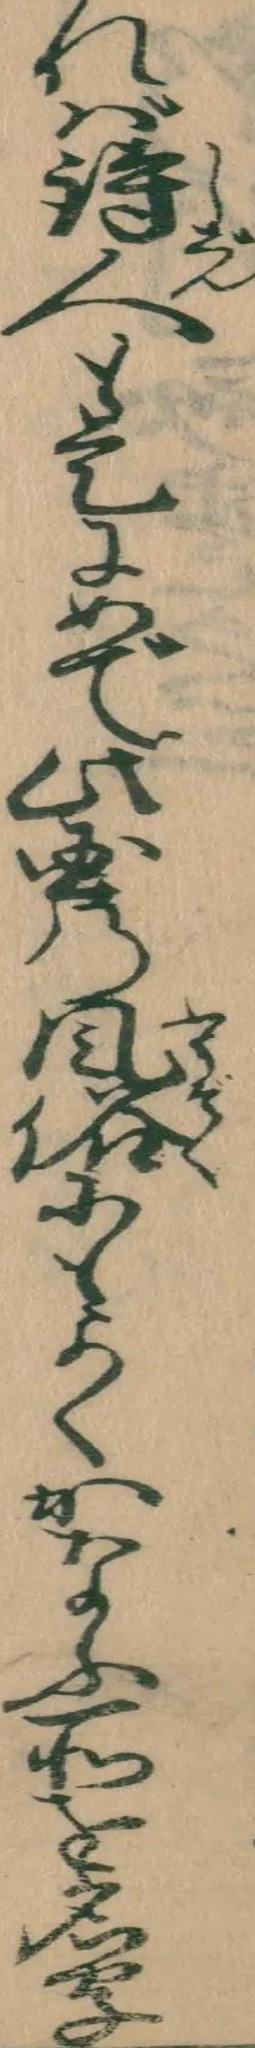れば詩人も是にめで此国の風俗にもよくかなふ所を名字
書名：新竹斎 5巻
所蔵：国立国会図書館 National Diet Library, JAPAN
